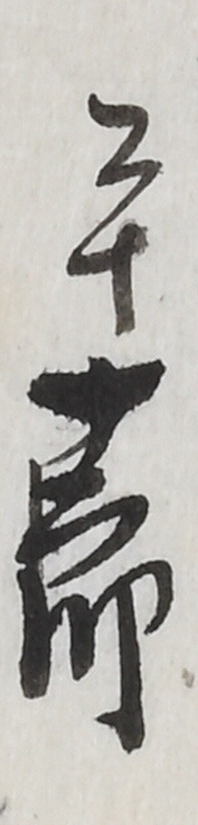二十郎
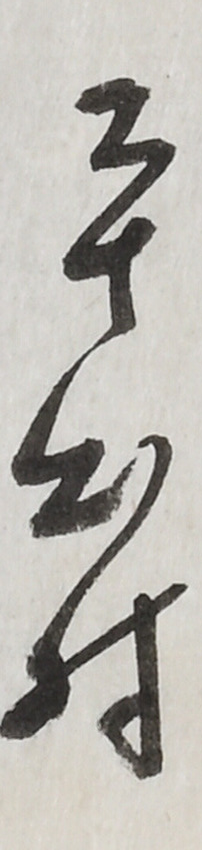平出村
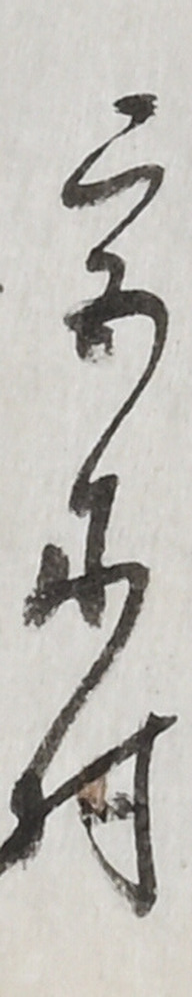宮木村
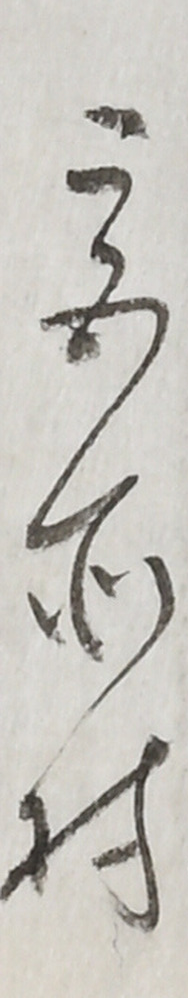宮所村
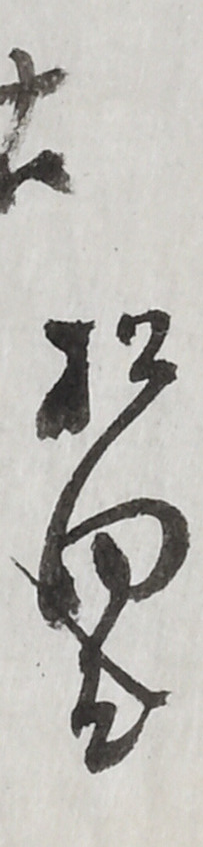右松田屋
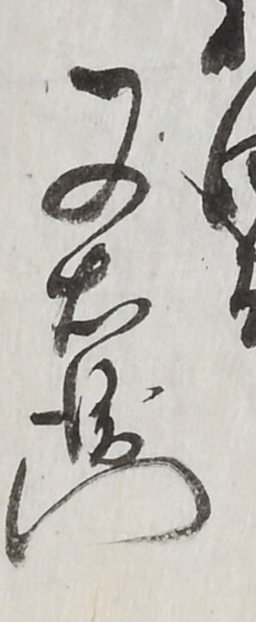又右衛門

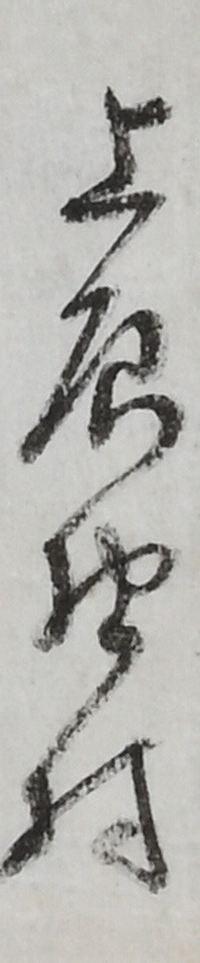上辰野村
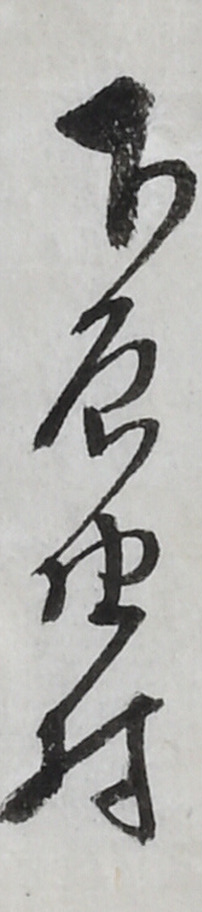下辰野村
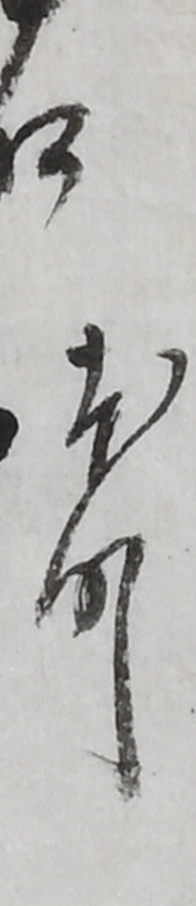右本町
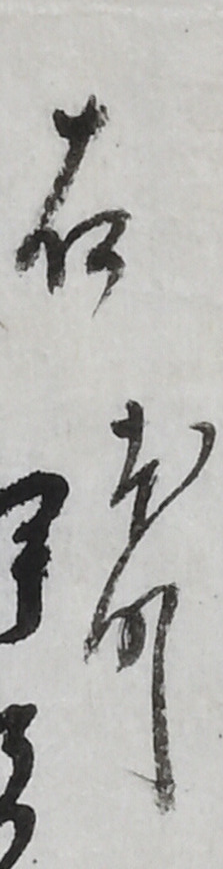右本町
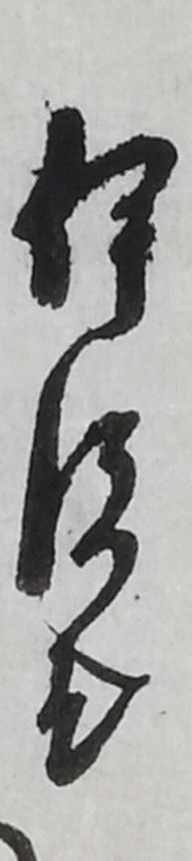伊沢屋
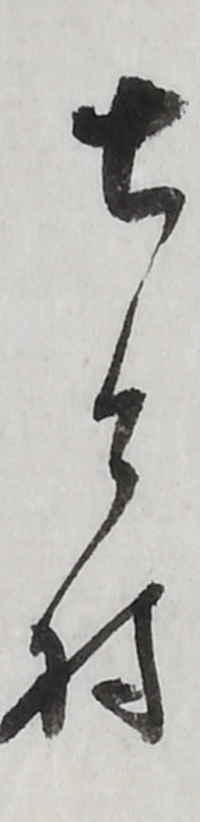七ヶ村
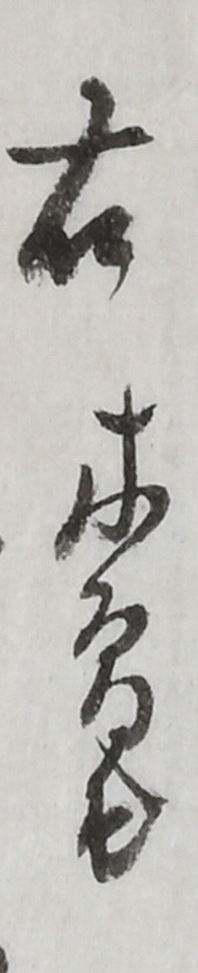右木曽屋
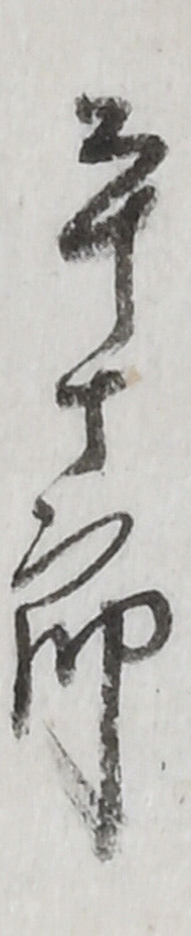平十郎

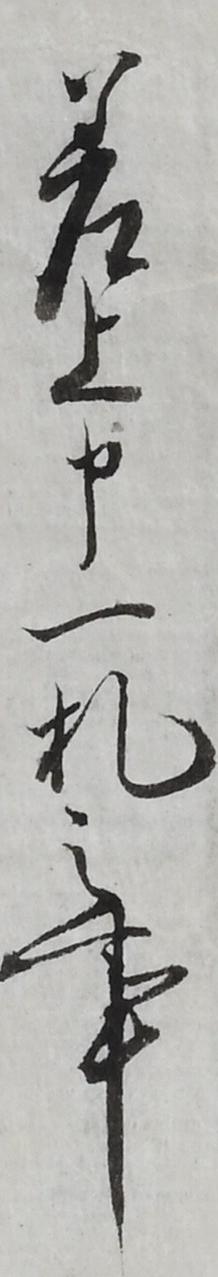差出申一札之事
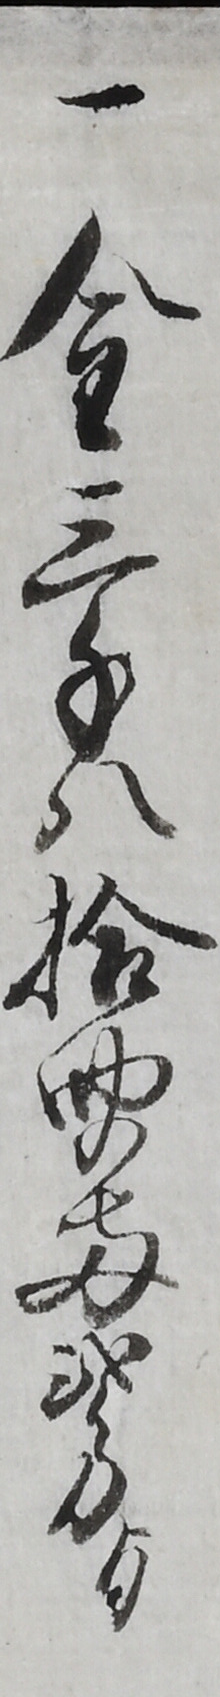一金三千八拾四両弐分と
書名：年内行事帳
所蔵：伊那市立高遠町図書館・合同会社AMANE
